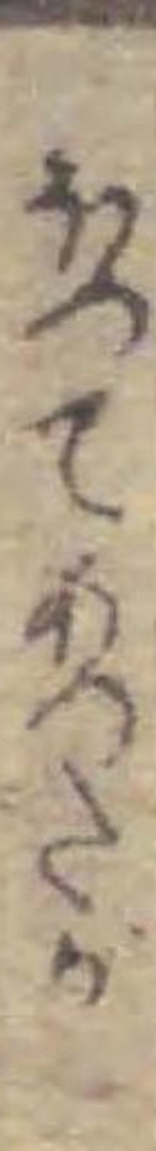ほつてあつたが
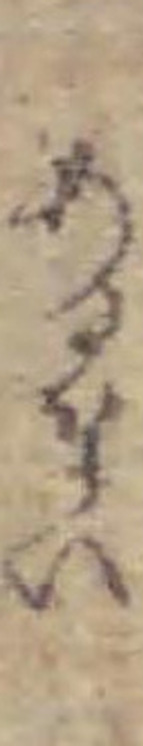あるまい
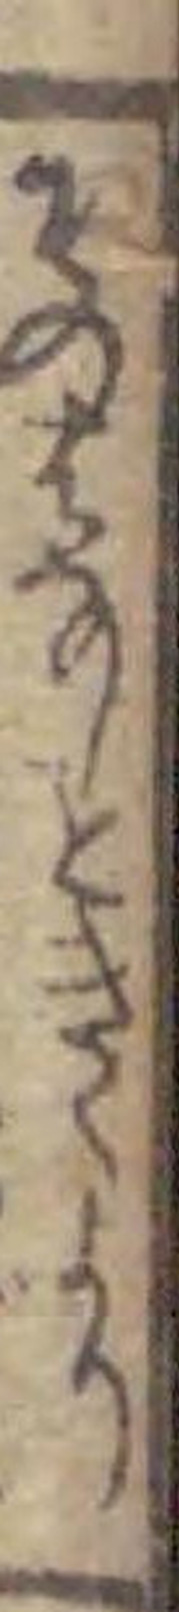そのはなしときくより
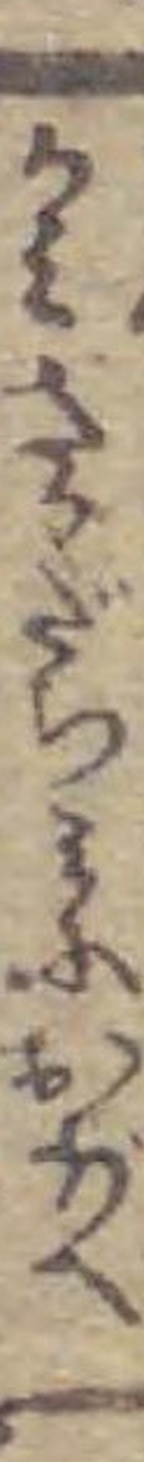かみさかだちみにおぼへ
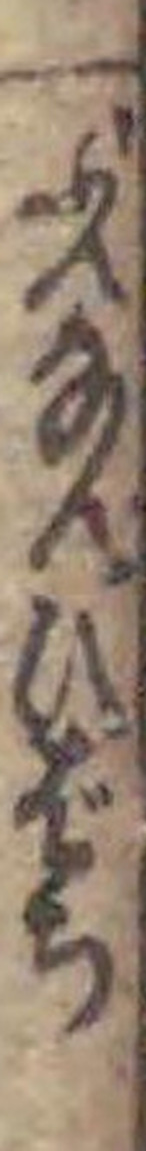ぶんなんひばち
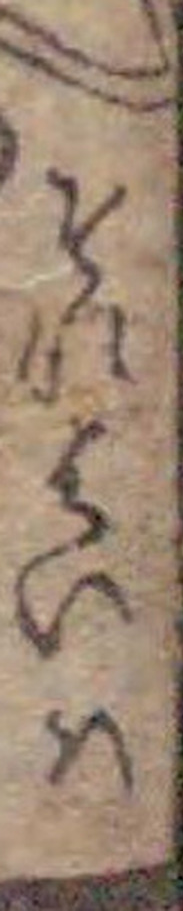それはいは
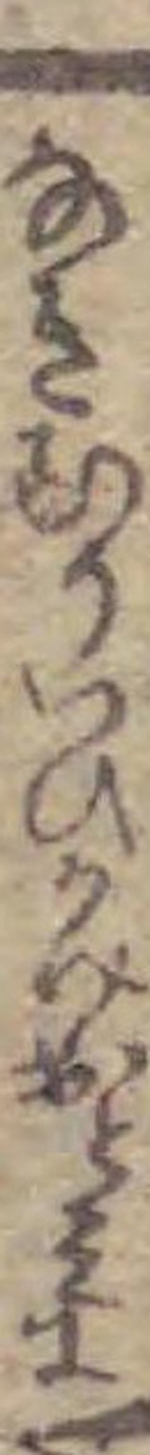なきむりいひかけおとみに
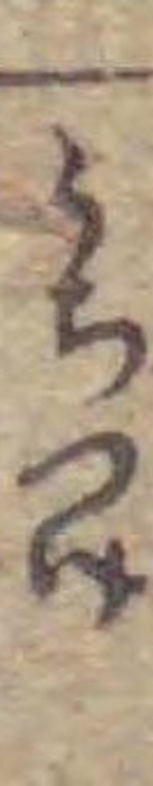うちつけ
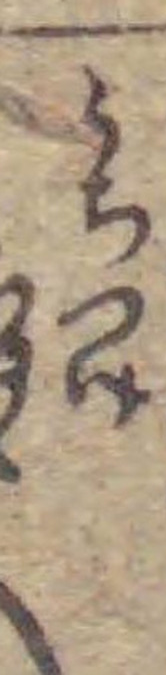うちつけ
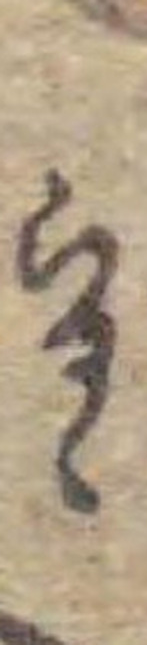らるゝ
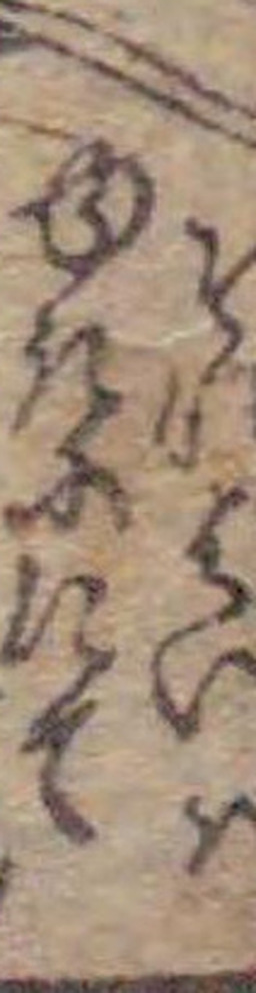ゆきににて
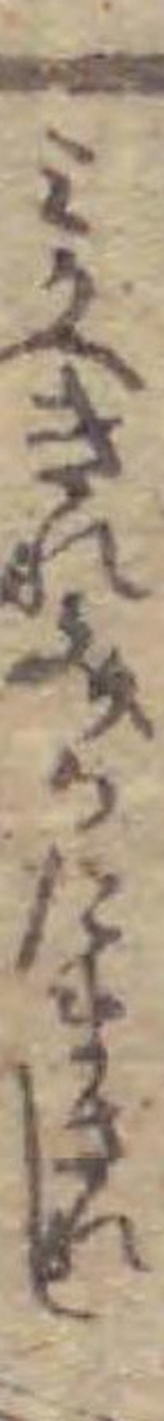みかへきれ文かたまされし
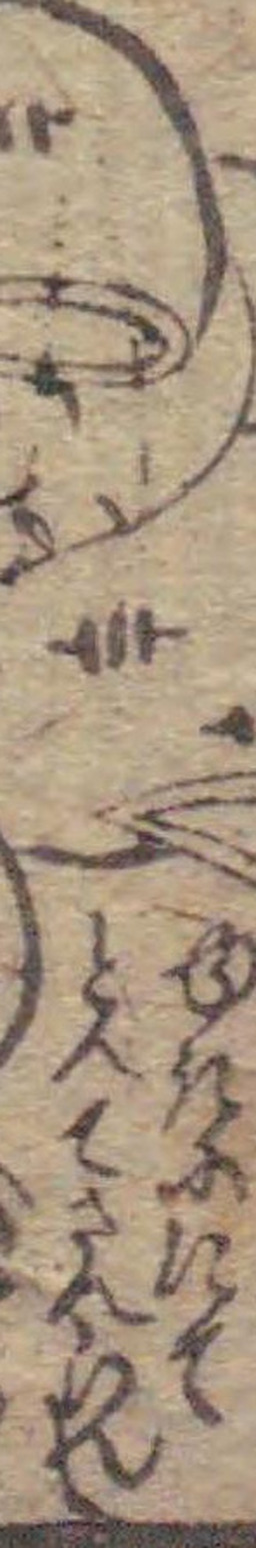とんてさんらんし
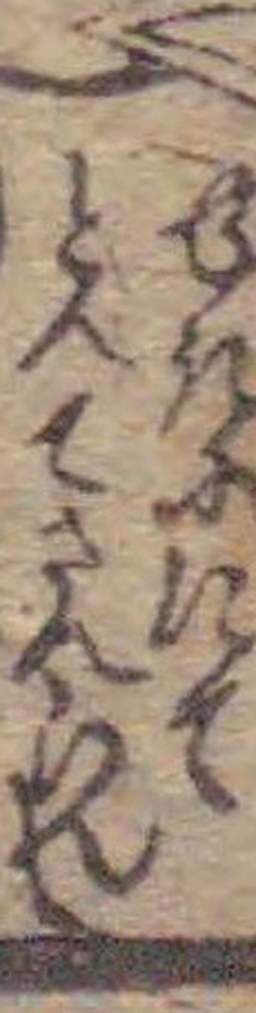とんてさんらんし
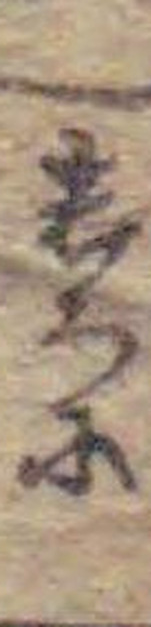しろに
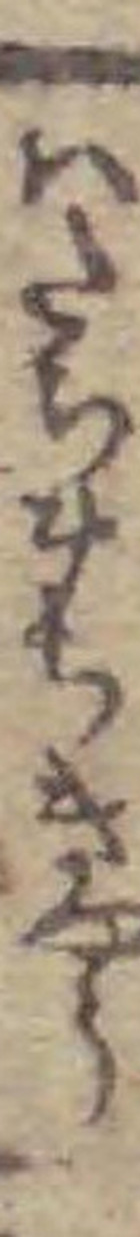はたちまちきやう
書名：芸者呼子鳥 : 2巻（松泉堂）
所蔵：国立国会図書館 National Diet Library, JAPAN
